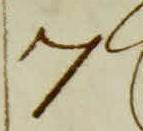7
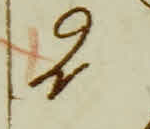2
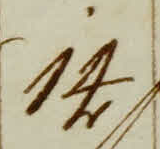14
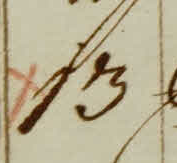13
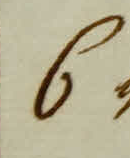6
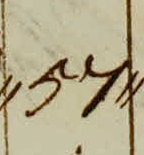57
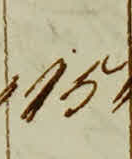15
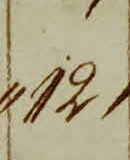12
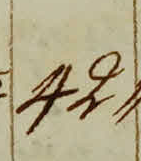42
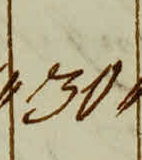30
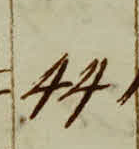44
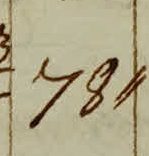78
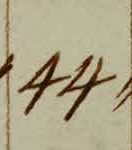44
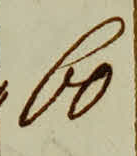60
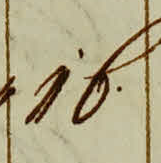16
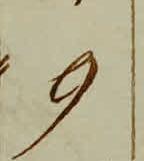9
